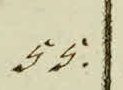55.
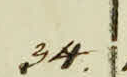34.
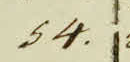54.
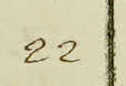22
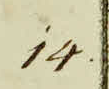14
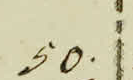50.
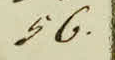56.
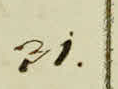31.
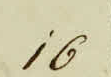16
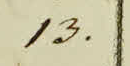13.
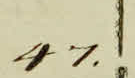47.
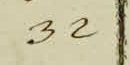32
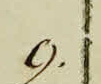9.
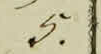5.
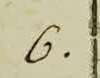6.
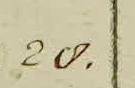20.
